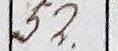52.
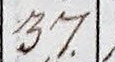37.
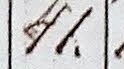41.
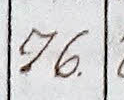76.
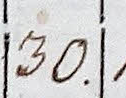30.
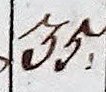35
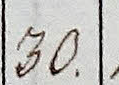30.
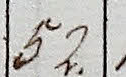52.
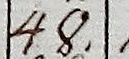48.
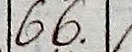66.
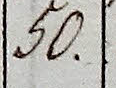50.
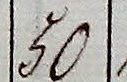50
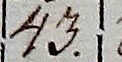43.
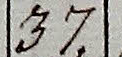37.
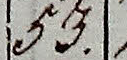53.
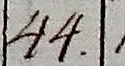44.
